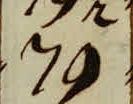79
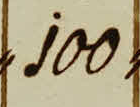100
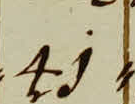41
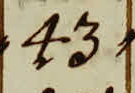43
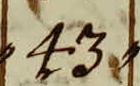43
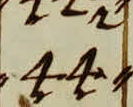44
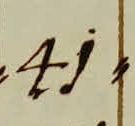41
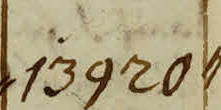13920
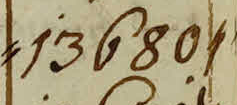13680
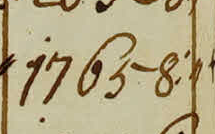17658.
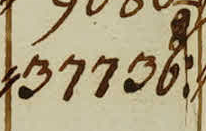37736
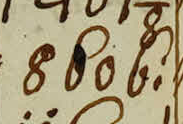8606
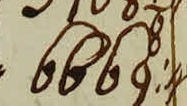6669
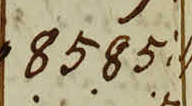8585
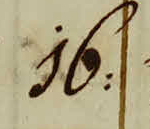16:
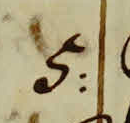5:
